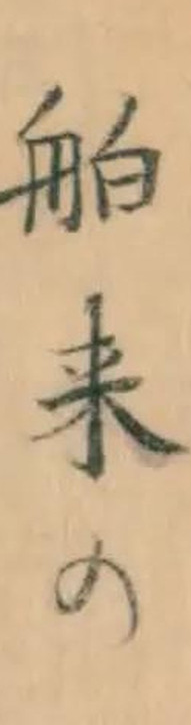舶来の
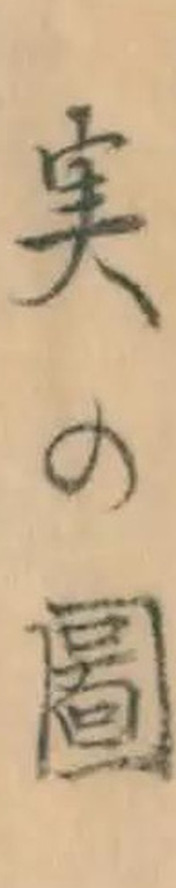実の図

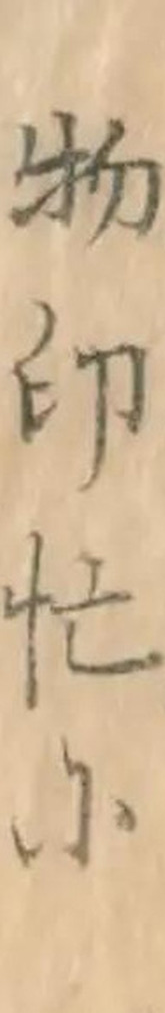物印忙に
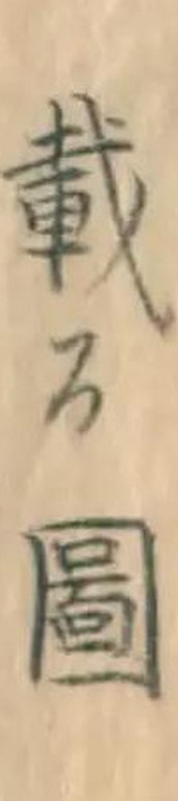載る図
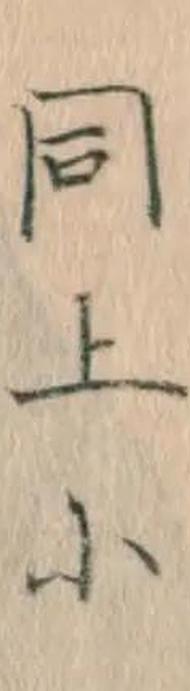同上に
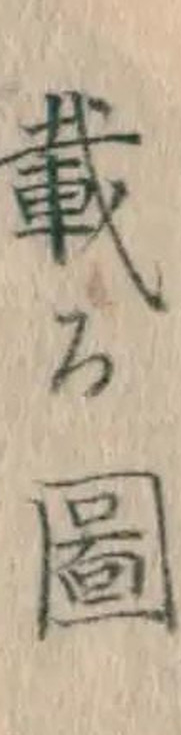載る図

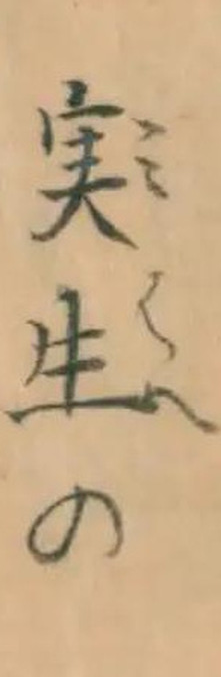実生の

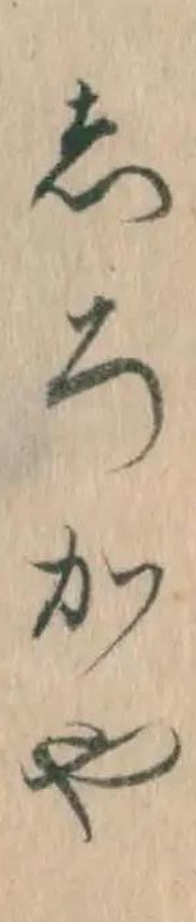しろかや
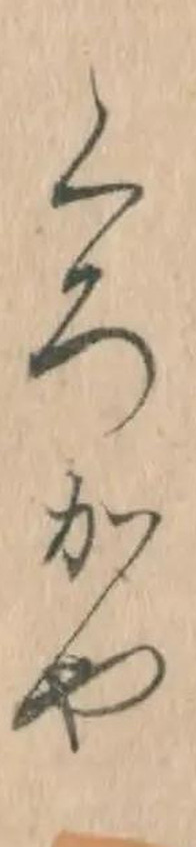くろかや

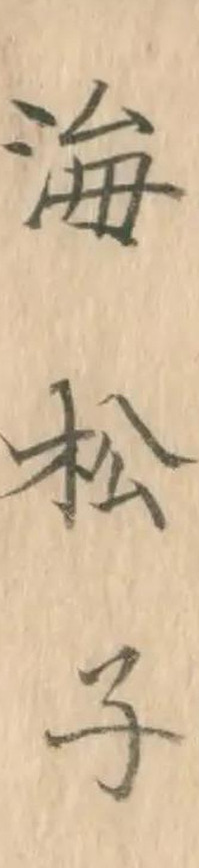海松子
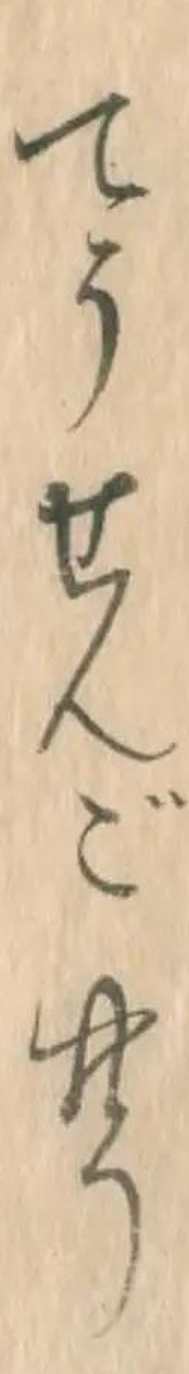てうせんごやう

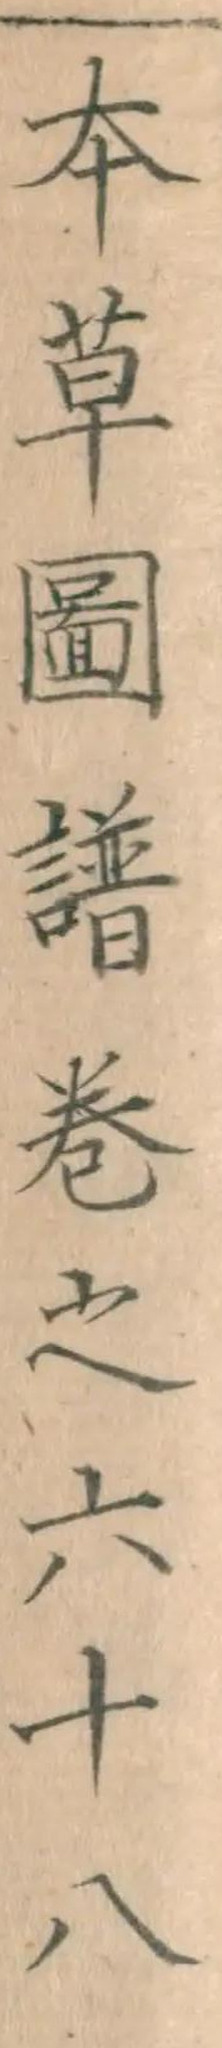本草図譜巻之六十八
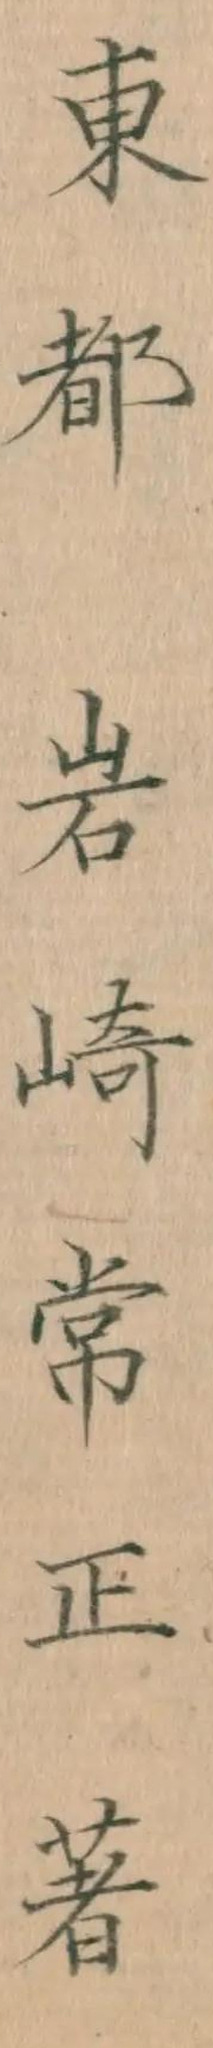東都岩崎常正著
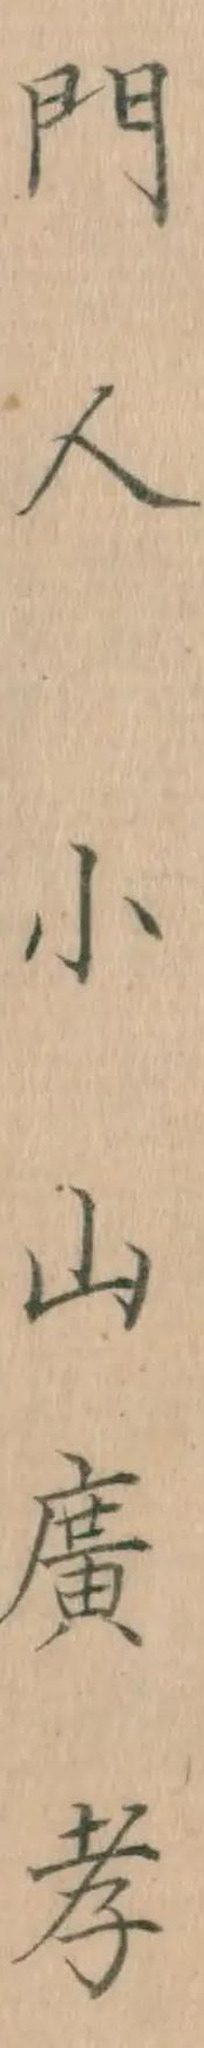門人小山広孝

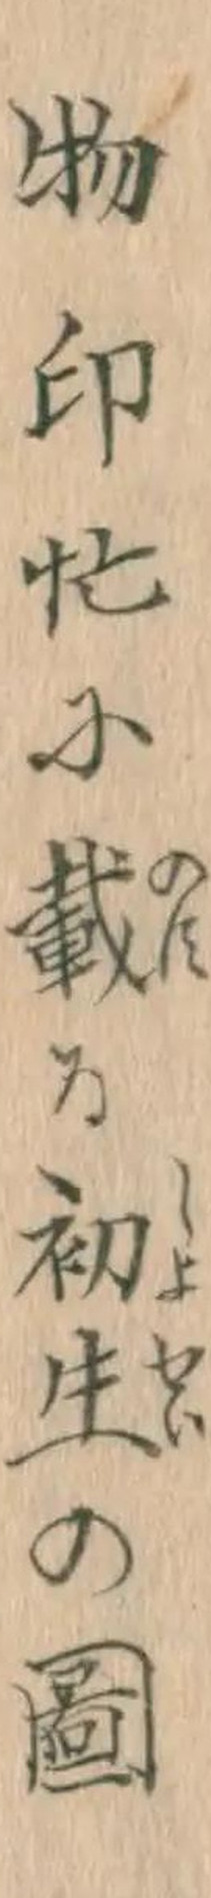物印忙に載る初生の図

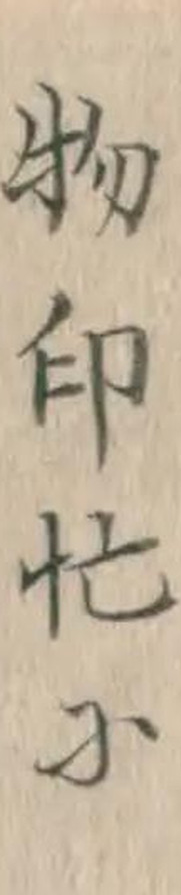物印忙に
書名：本草図譜. 巻67-69
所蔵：国立国会図書館 National Diet Library, JAPAN
